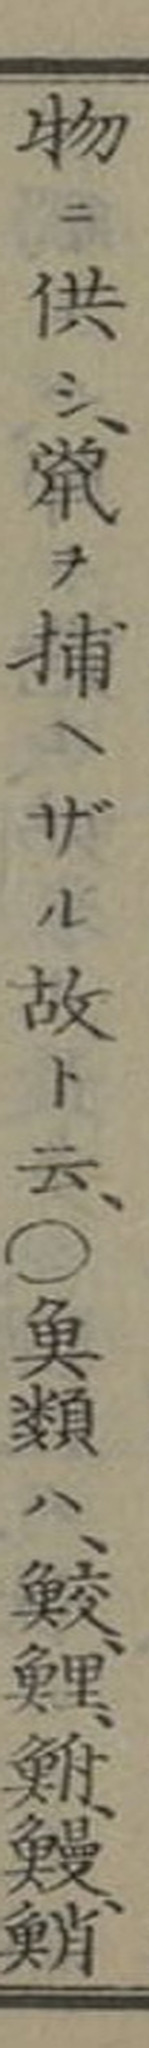物ニ供シ、鼠ヲ捕ヘザル故ト云、○魚類ハ、鮫、鯉、鮒、鰻、鮹
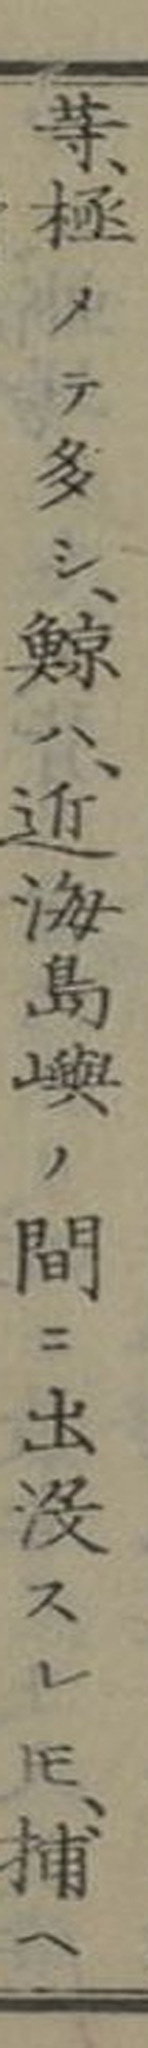等、極メテ多シ、鯨ハ、近海島嶼ノ間ニ出没スレトモ、捕ヘ
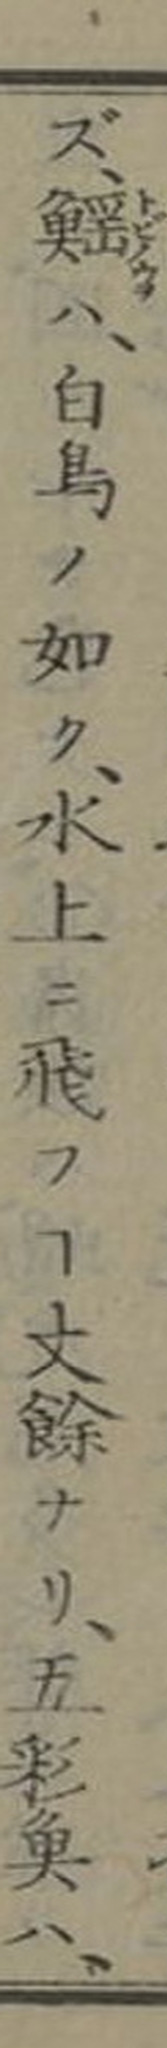ズ、鰩ハ、白鳥ノ如ク、水上ニ飛フヿ丈余ナリ、五彩魚ハ、
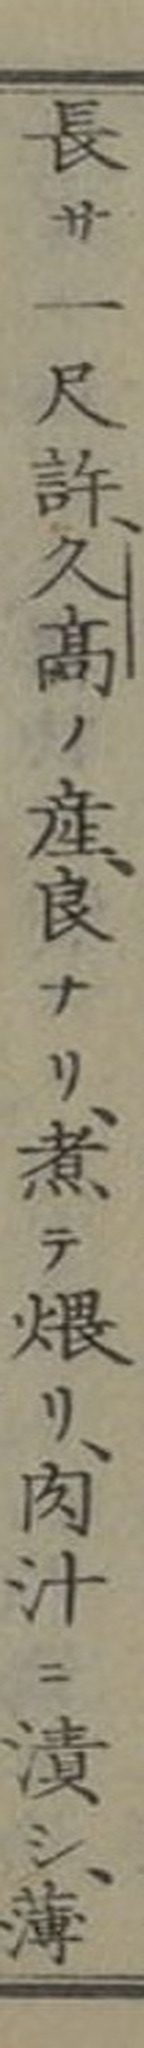長サ一尺許、久高ノ産、良ナリ、煮テ煨リ、肉汁ニ漬シ、薄
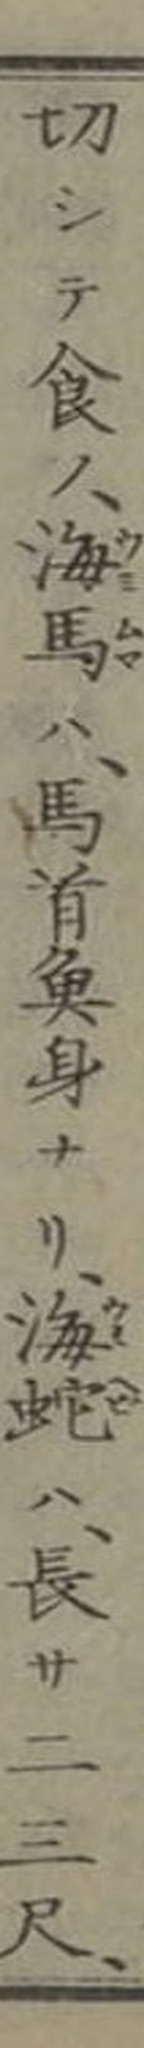切シテ食ノ、海馬ハ、馬首魚身ナリ、海蛇ハ、長サ二三尺、
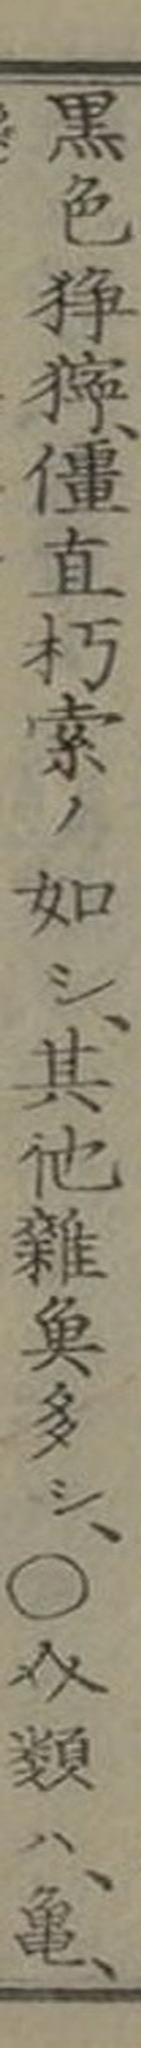黒色獰、僵直朽索ノ如シ、其他雑魚多シ、○介類ハ、亀、
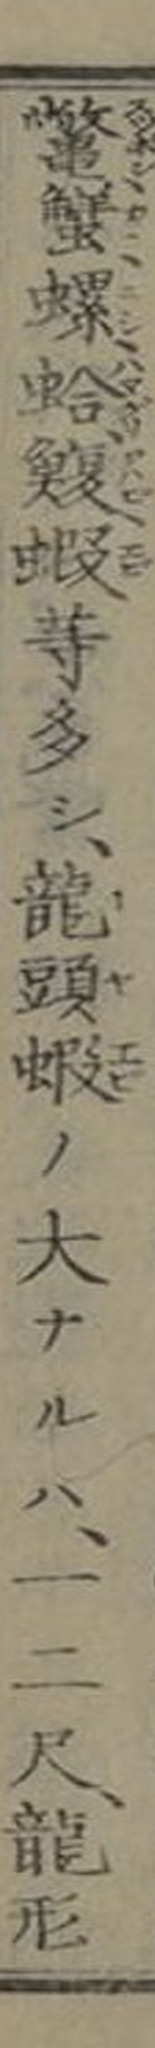鼈、蟹、螺、蛤、鰒、蝦等多シ、竜頭蝦ノ大ナルハ、一二尺、竜形

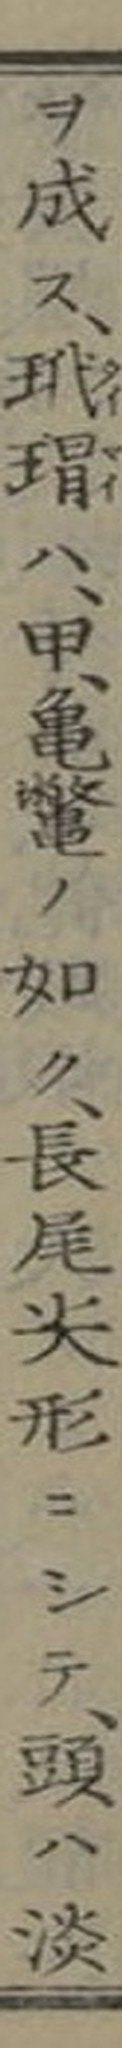ヲ成ス、玳瑁ハ、甲、亀鼈ノ如ク、長尾尖形ニシテ、頭ハ淡
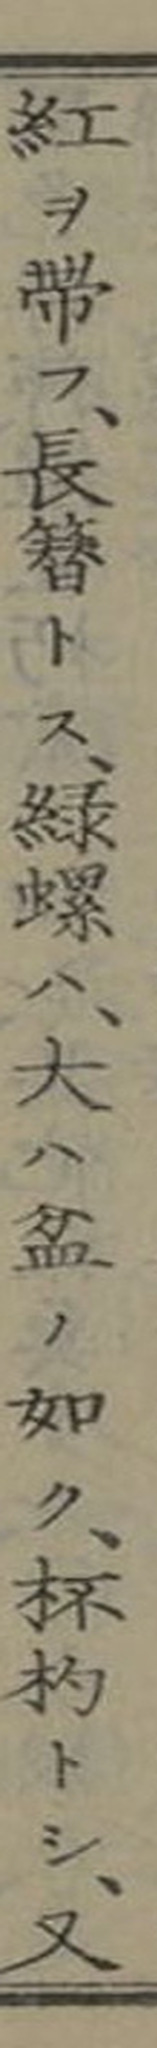紅ヲ帯フ、長簪トス、緑螺ハ、大ハ盆ノ如ク、杯杓トシ、又
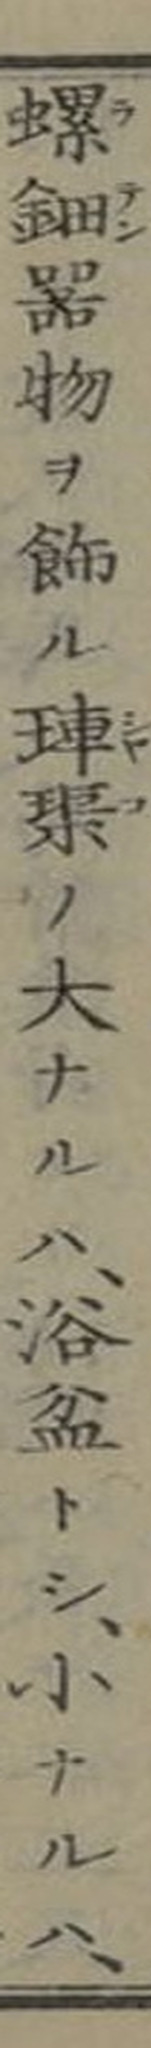螺鈿器物ヲ飾ルノ大ナルハ、浴盆トシ、小ナルハ、
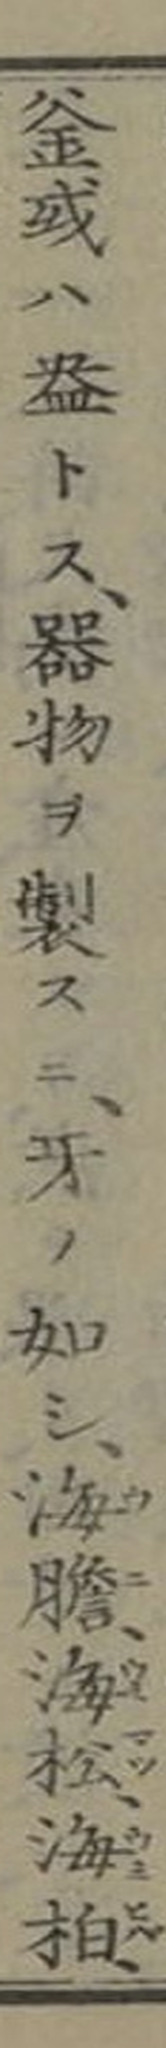釜或ハ盎トス、器物ヲ製スニ、牙ノ如シ、海胆、海松、海柏、
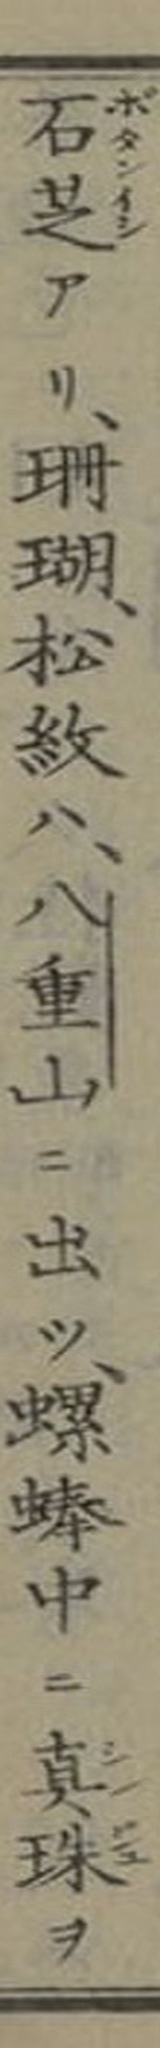石芝アリ、珊瑚、松紋ハ、八重山ニ出ツ、螺蜯中ニ真珠ヲ
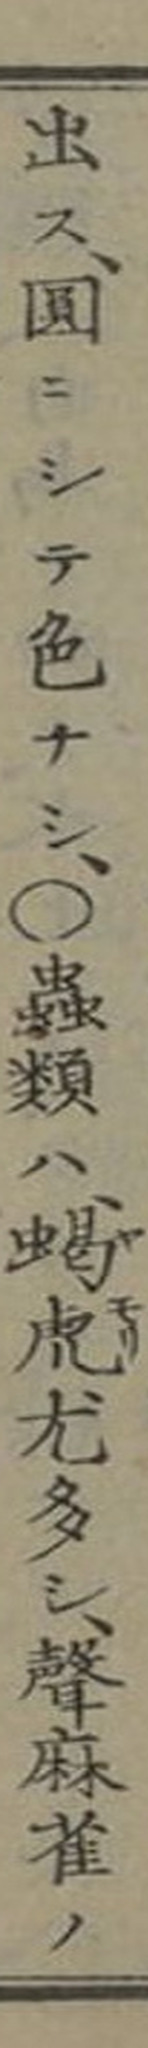出ス、円ニシテ色ナシ、○虫類ハ、蝎虎尤多シ、声麻雀ノ
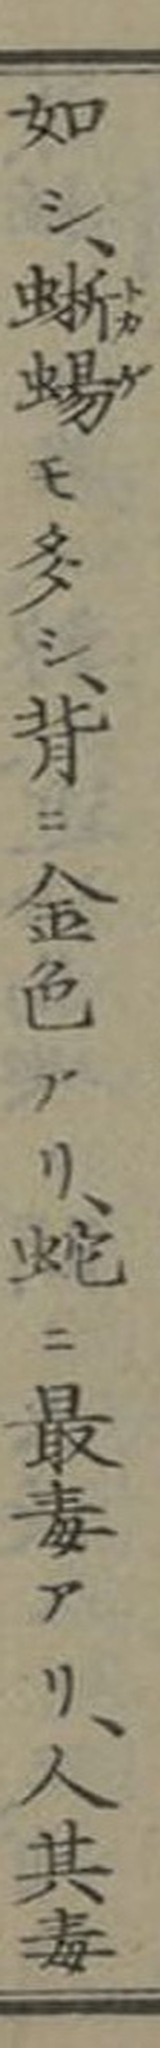如シ、蜥蜴モ多シ、背ニ金色アリ、蛇ニ最毒アリ、人其毒
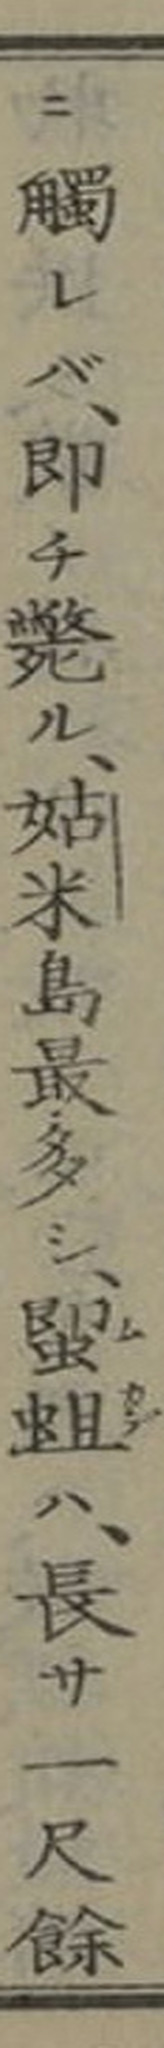ニ触レバ、即チ斃ル、姑米島最多シ、蝍蛆ハ、長サ一尺余
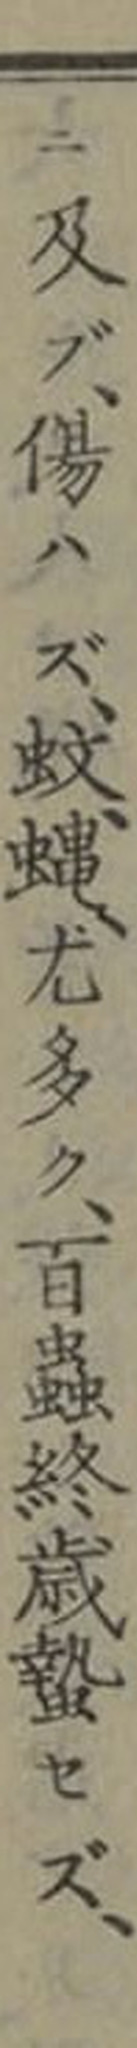ニ及ブ、傷ハズ、蚊、蠅、尤多ク、百虫終歳蟄セズ、
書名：琉球新誌 図附 上
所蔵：University of the Ryukyus Library
